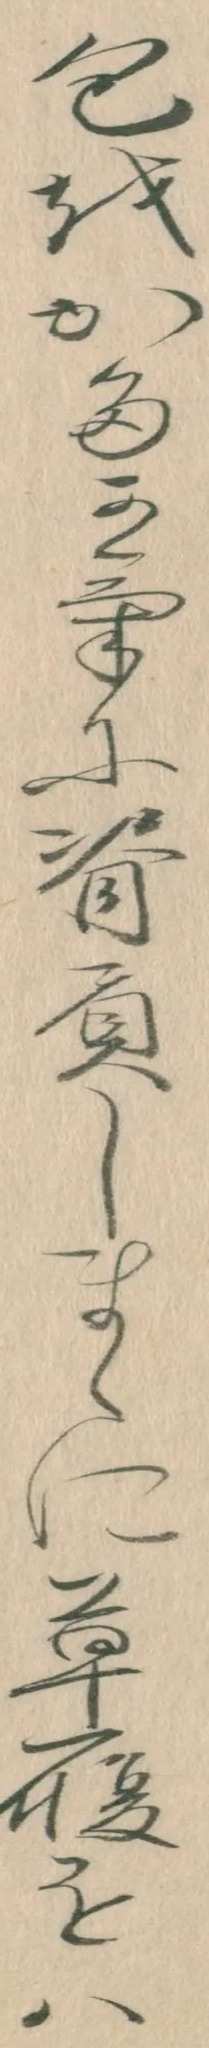包をかたかけに背負しまゝに草履をは
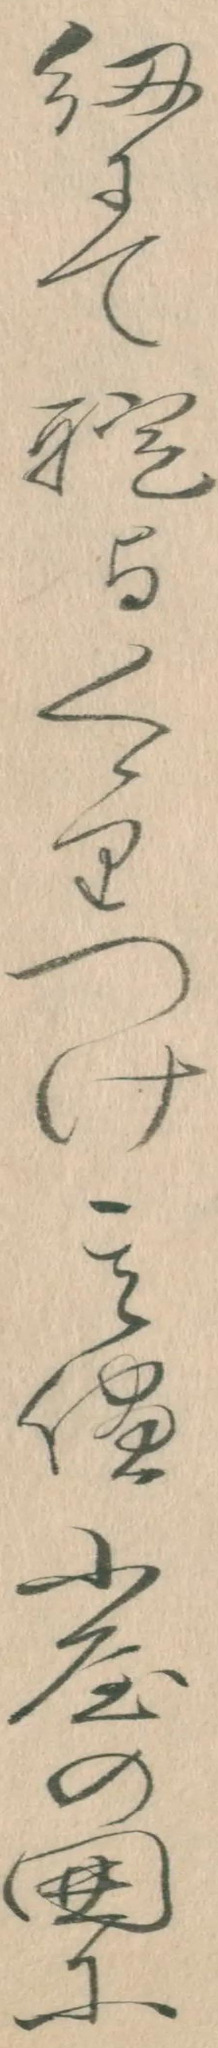紐にて聢とくゝりつけ其儘小屋の囲に
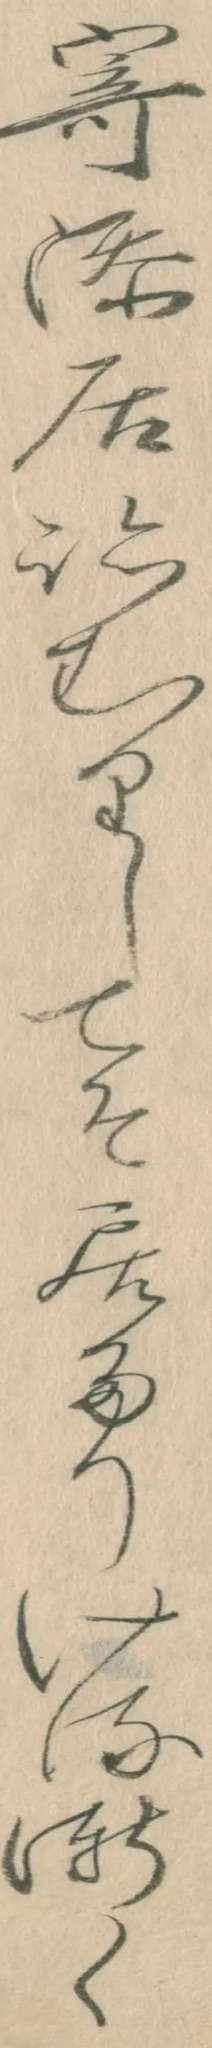寄添居ねむりしてそ居たりける漸く

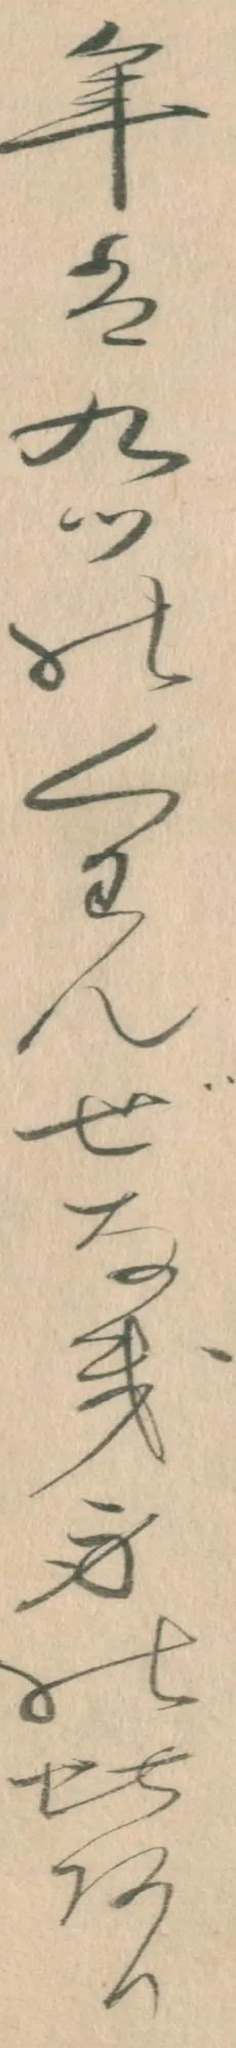年は九つのくわんぜなき身の此あり
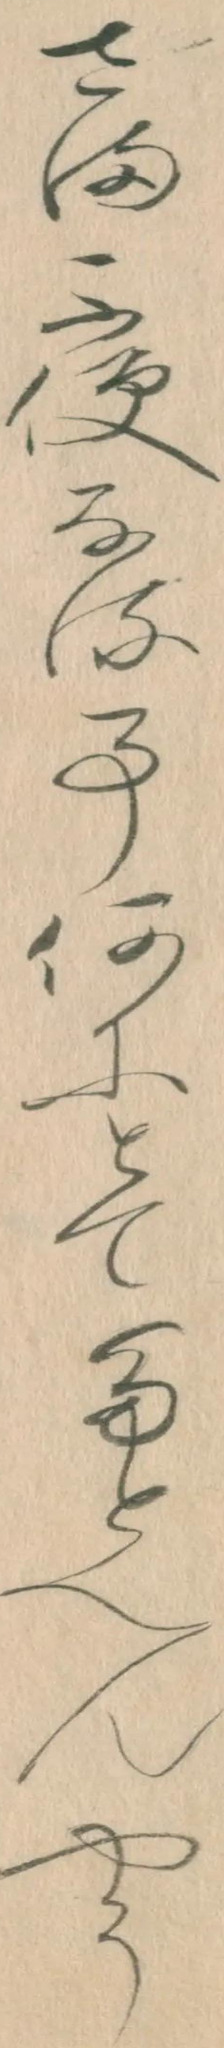さま不便なる事何にとてたとへんやう
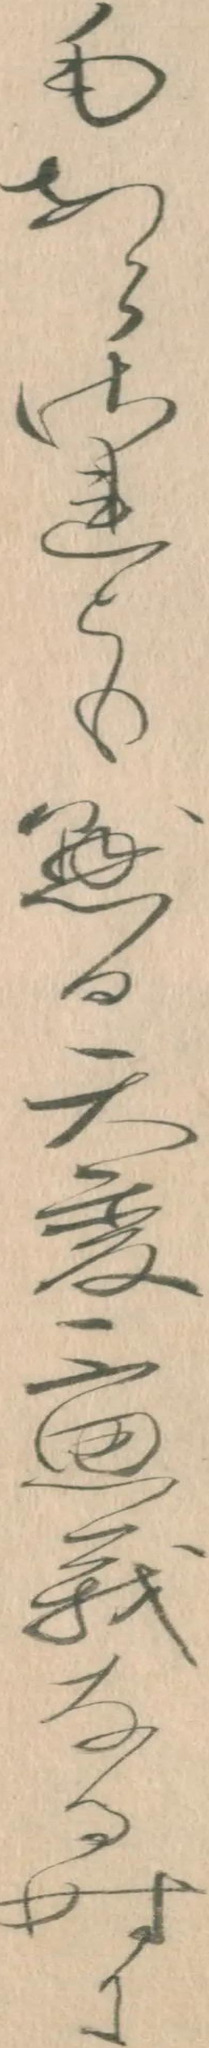もあらされとも懸る天変不思義なる時に
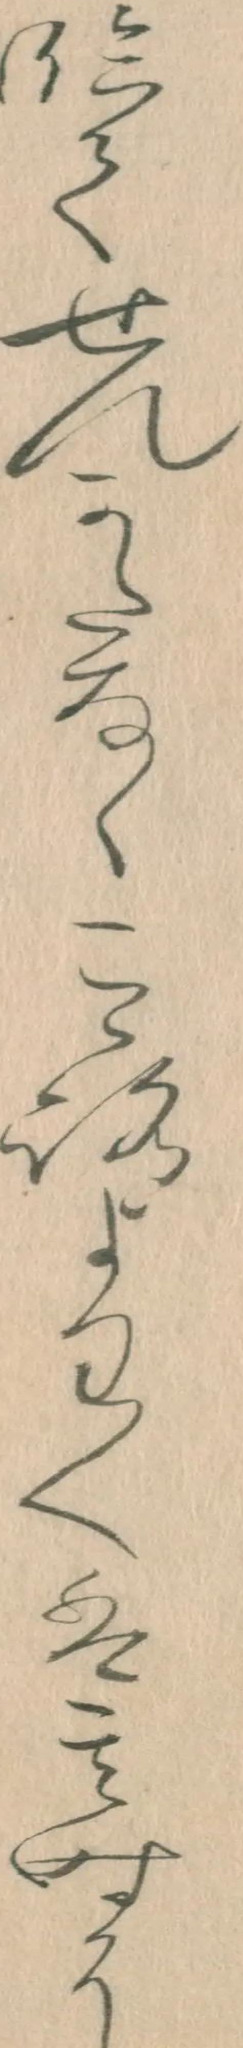臨てせんかたなくこゝろよわくは其時に
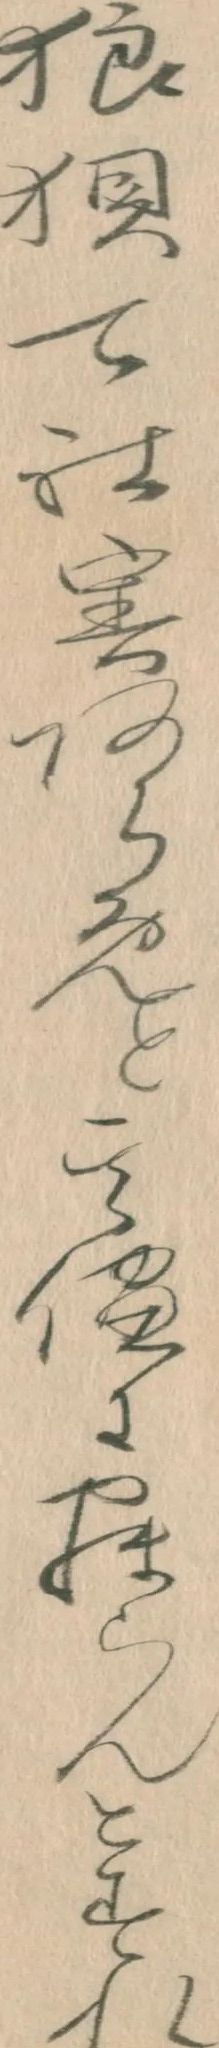狼狽て社害あらめと其儘に寐らんとすれ
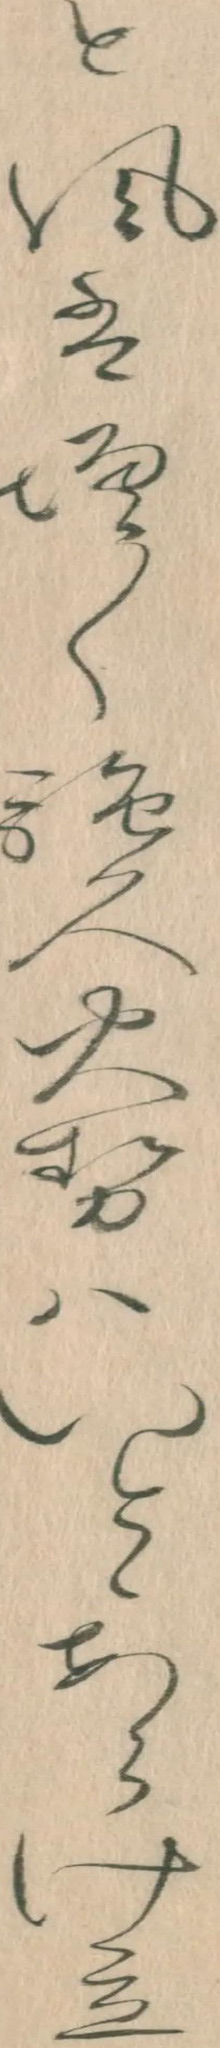と風は増〳〵強く火勢はいとゝあらけ立
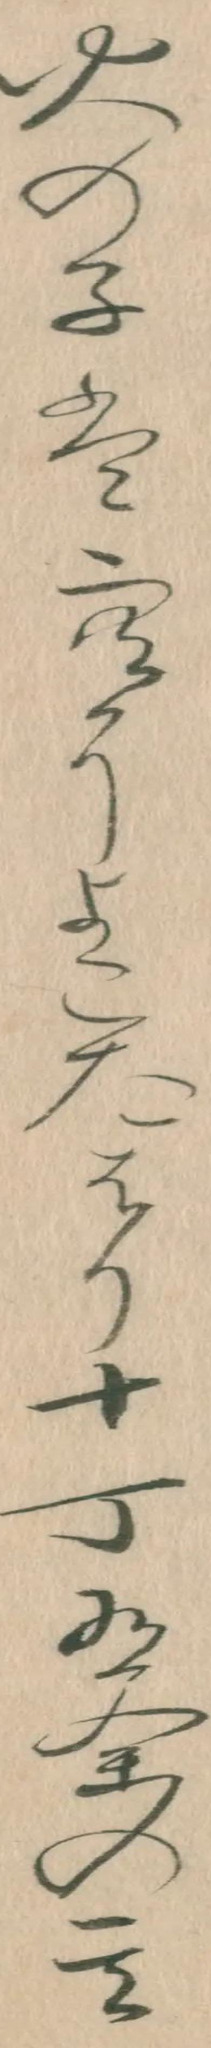火の子は空によこたはり十丁有余の其
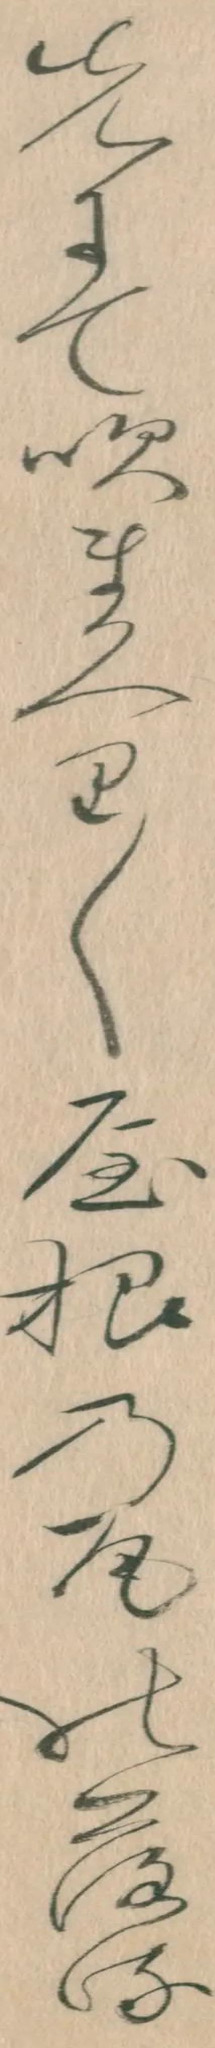先にて吹まくり〳〵屋根の瓦の落る
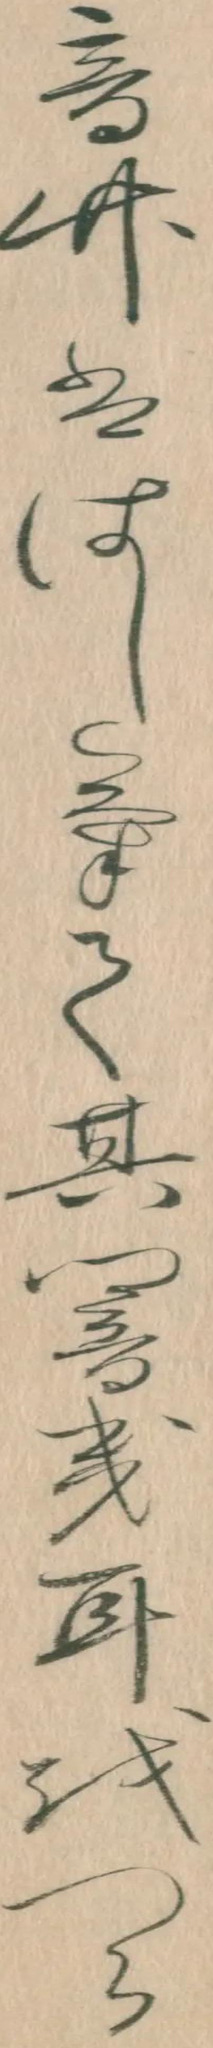音竹ははしけて其響き耳をつら
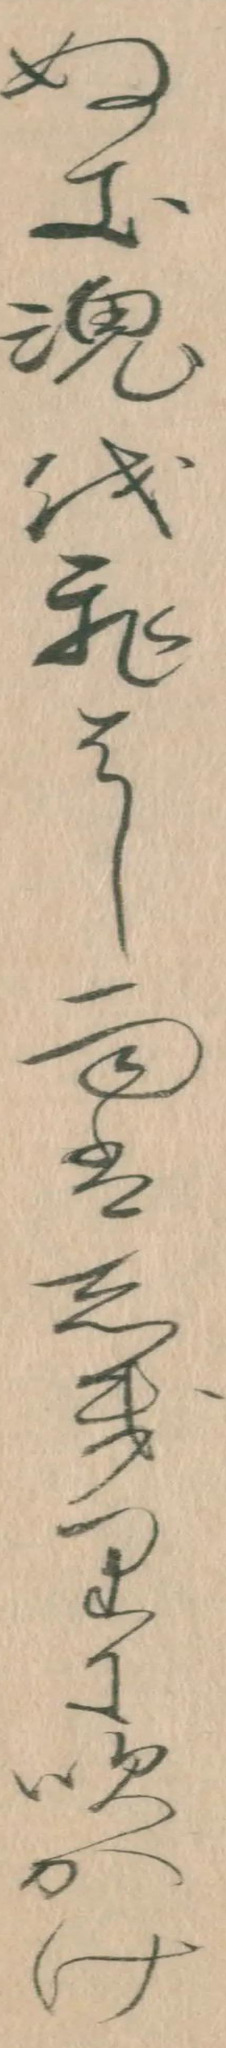ぬき魂を飛はし雨はしきりに吹かけ
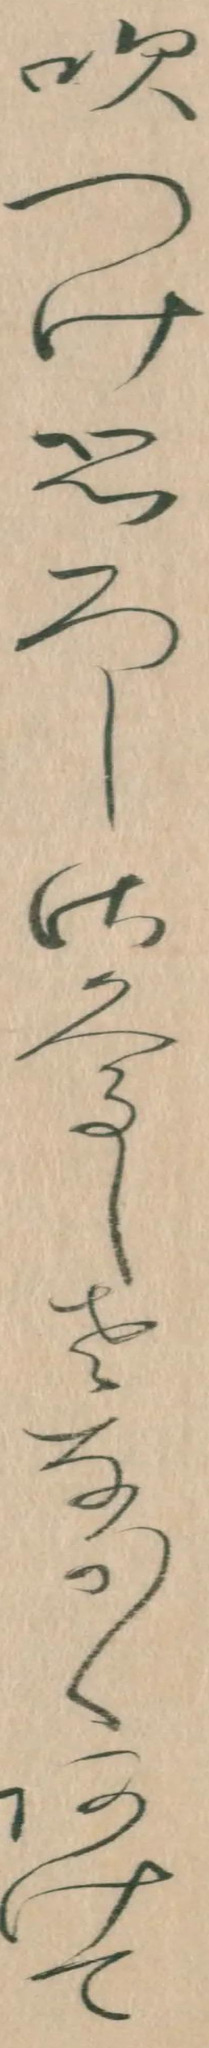吹つけ恐ろしさくるしさなかくあけて
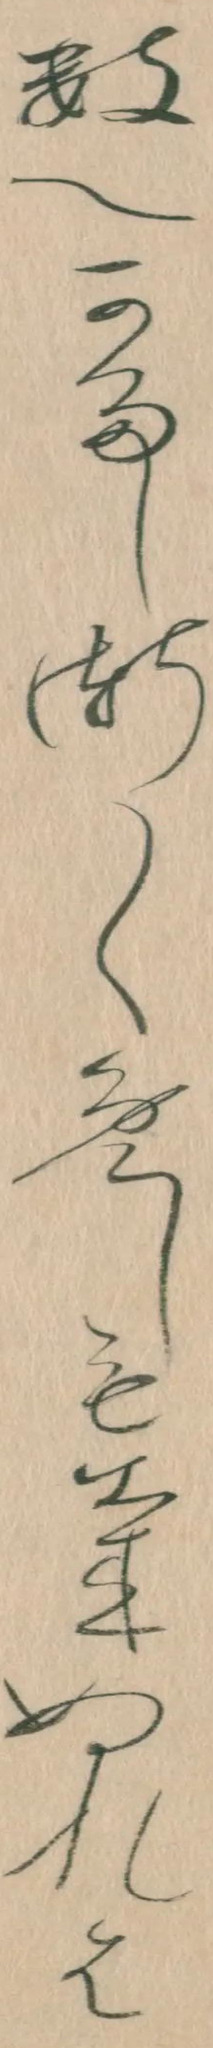数へかたし漸くめしも出来ぬれは
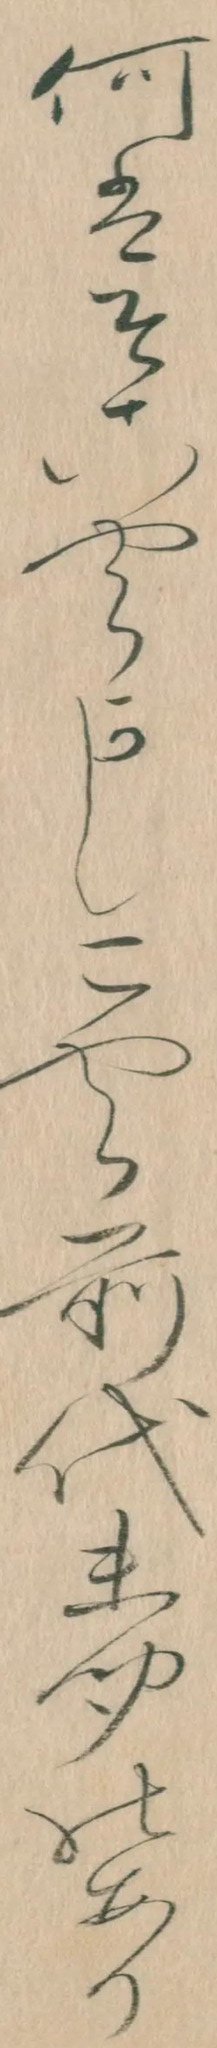何はそこやらかしこやら前代未聞のあり
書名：俗語之種. [5]
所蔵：国立国会図書館 National Diet Library, JAPAN
